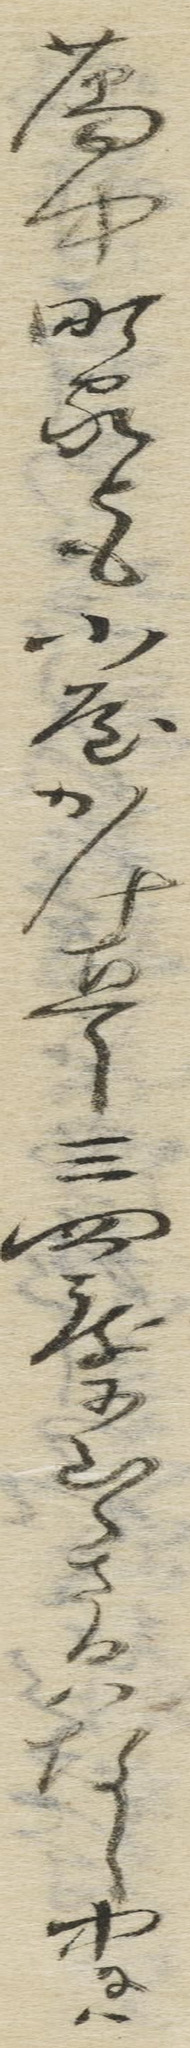藩中町家とも小屋かけ直し三四度に至さるハなし中にハ
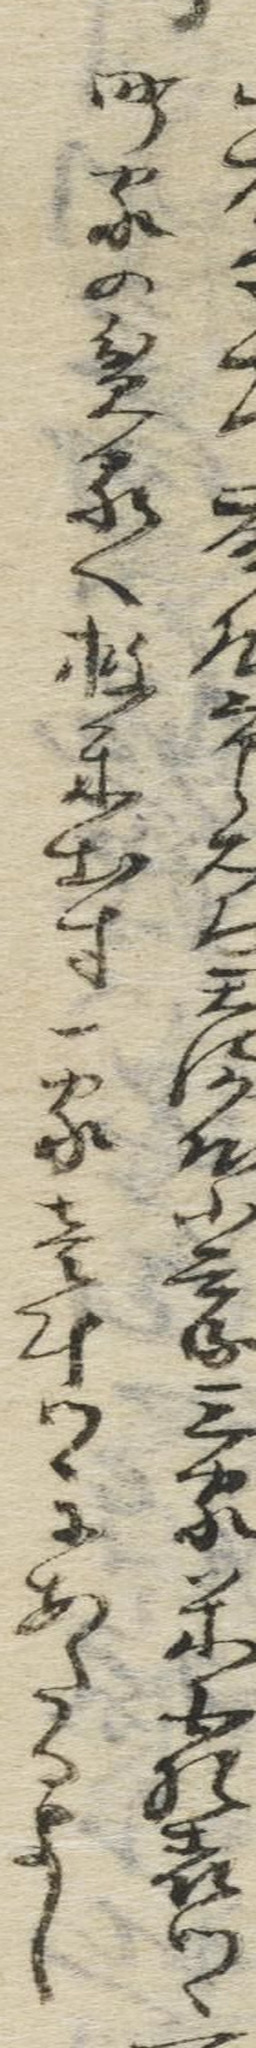町家の貧家へ救米出す一家壱斗ツゝ二あたるよし
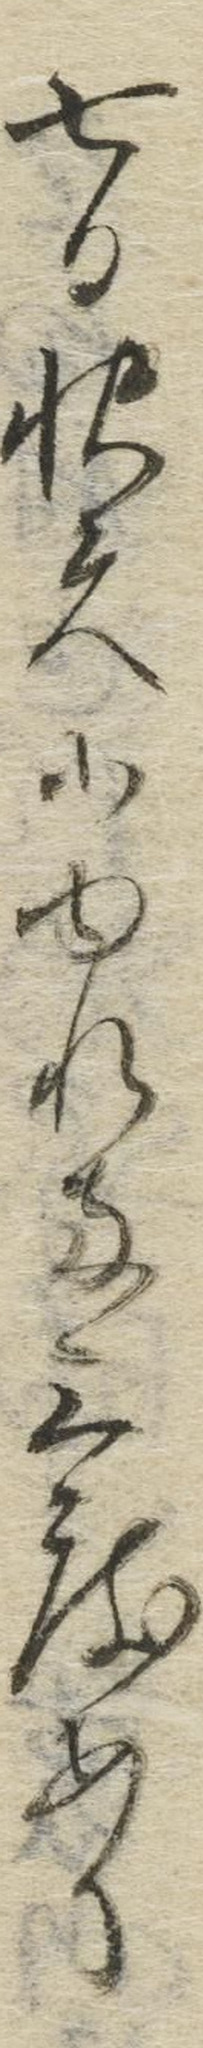七日快天小ゆれ両三度あり
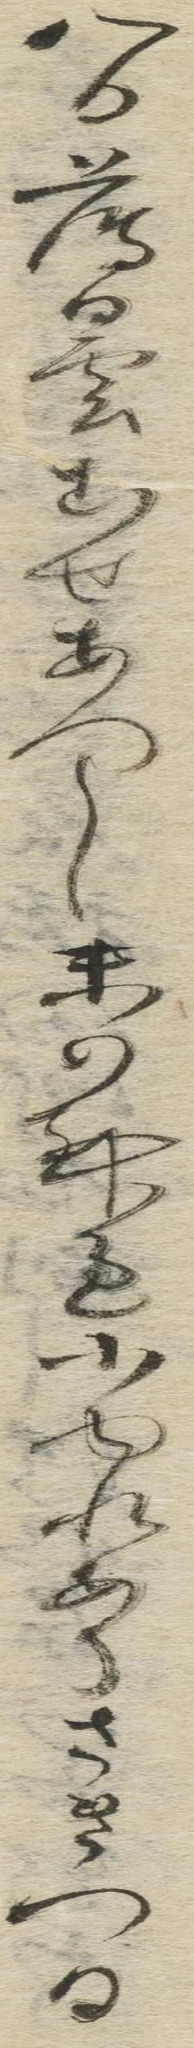八日薄曇むせあつし未の刻過小ゆれありさきつる
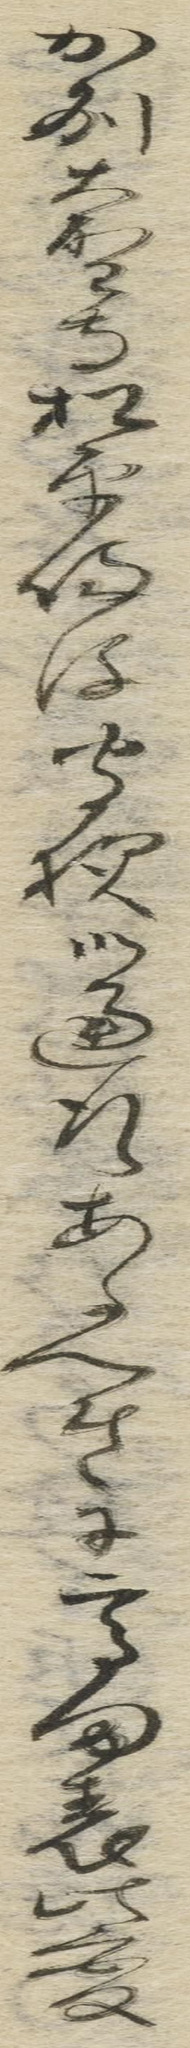加州大聖寺松平備後守様御通行あるへきに高田表此変
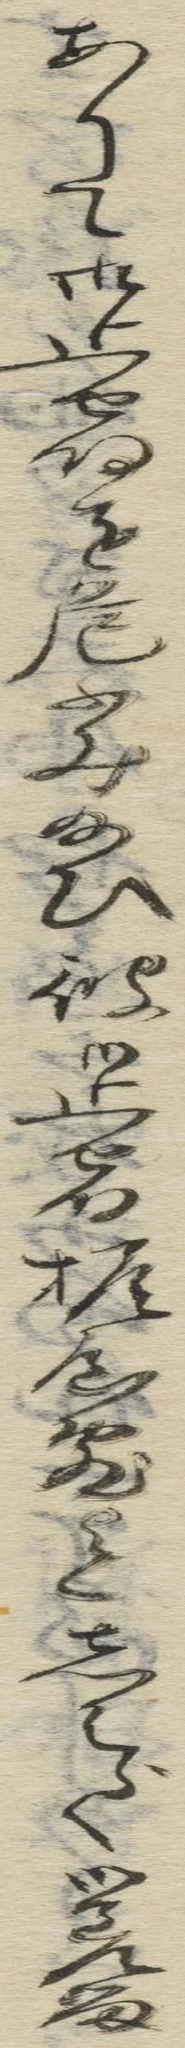ありて御止宿を危ふみ給ひ彼御止宿梶屋敷迄しはらく御差留
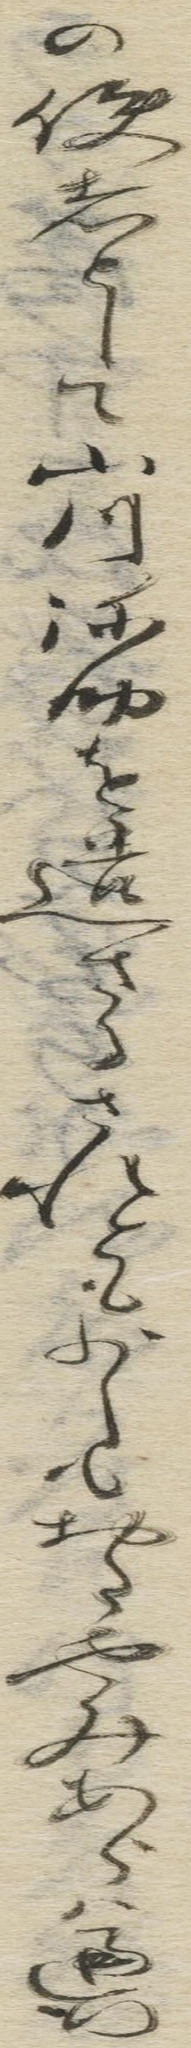の使者として山河弥助を遣さるされとも少しもおたやみあらハ通行
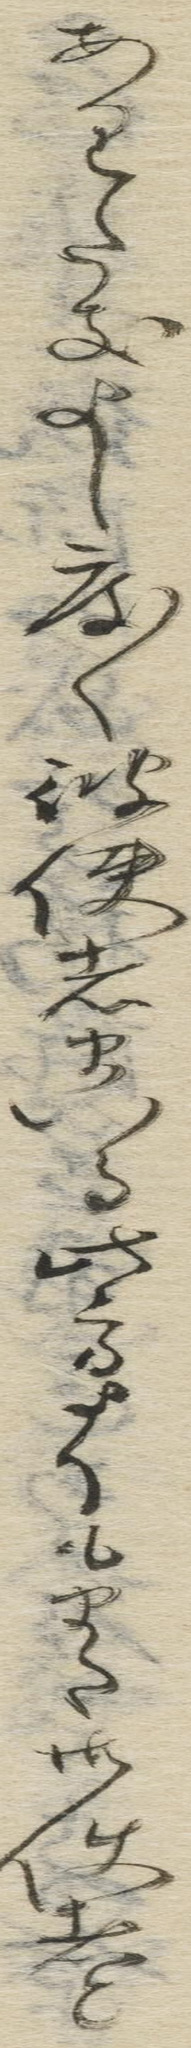ありたきよし度々彼使者まいる此方よりもまた御使者と
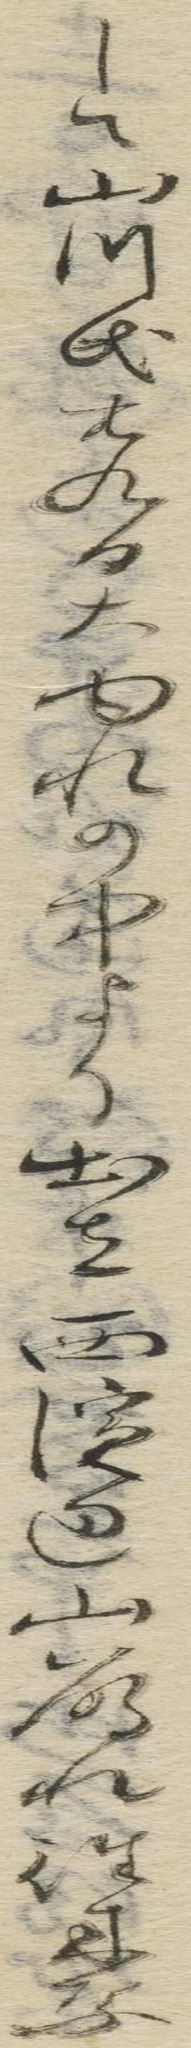して山川氏廿九日大ゆれの中より出立西浜辺山崩れ往来な
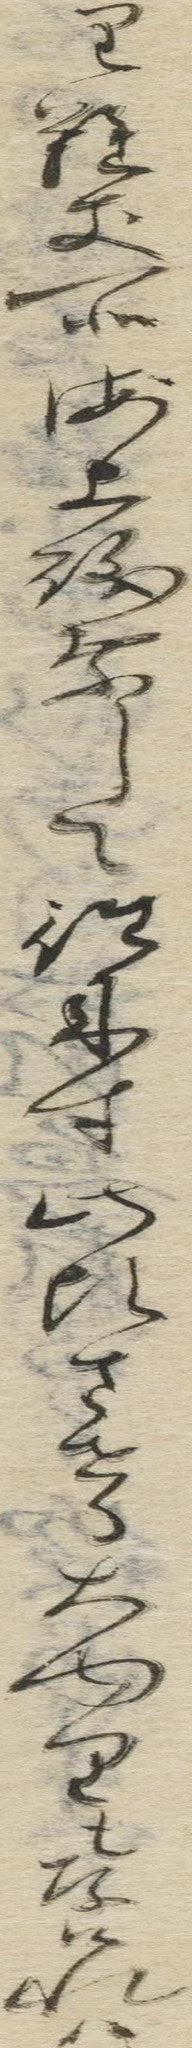り難丈所海上筏乗して往来す此頃さをり大ゆりもなけれハ
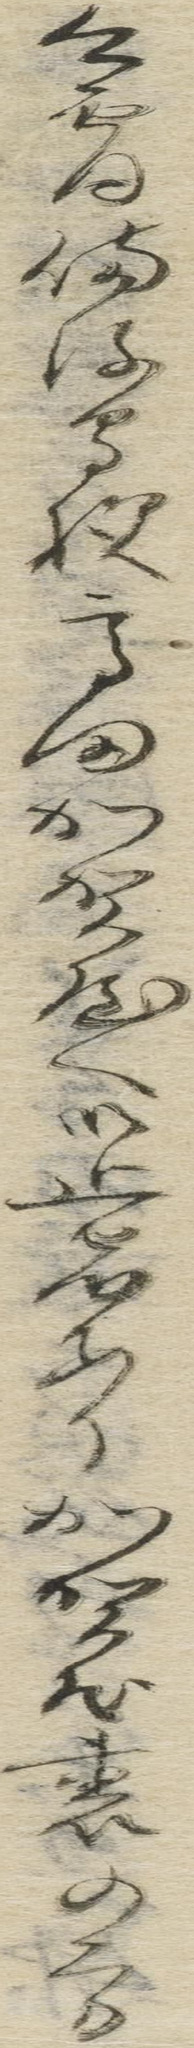今宵備後守様高田加賀屋へ御止宿あり加賀屋裏の方
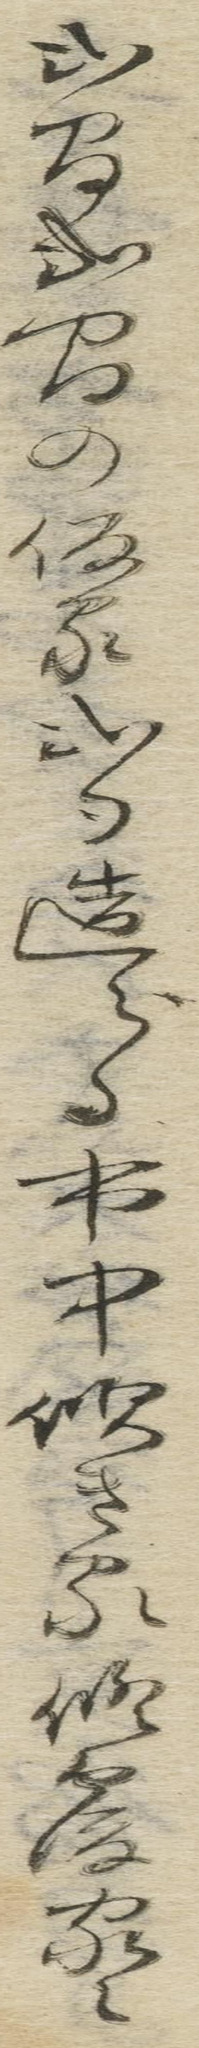弐間弐間の仮小屋弐ツ作らる市中傾き家修覆家々
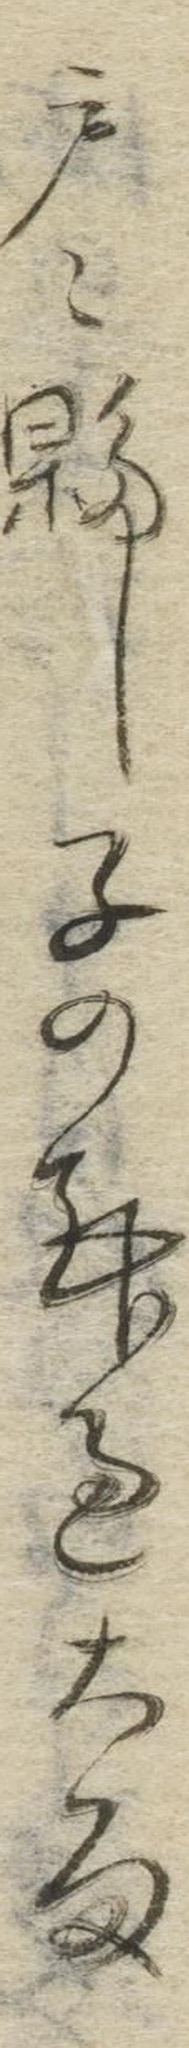戸々夥し子の刻過大雨
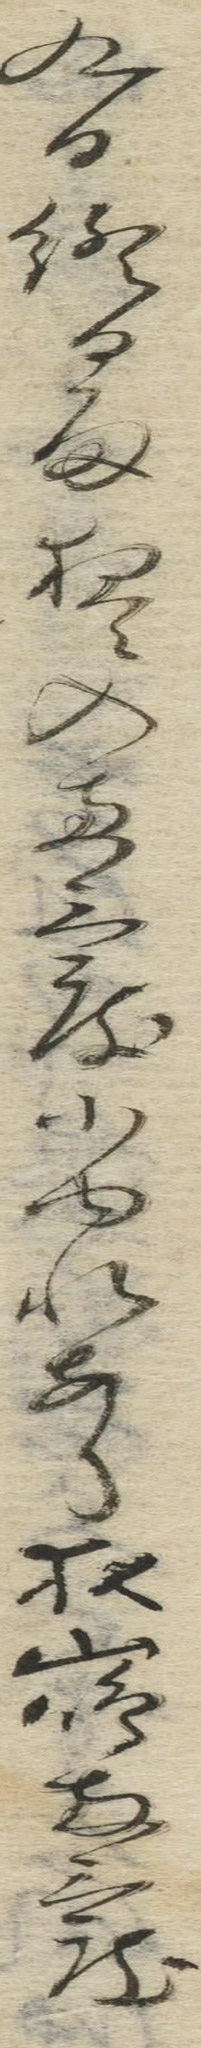九日終日雨夜二入両三度小ゆれあり夜山鳴両三度
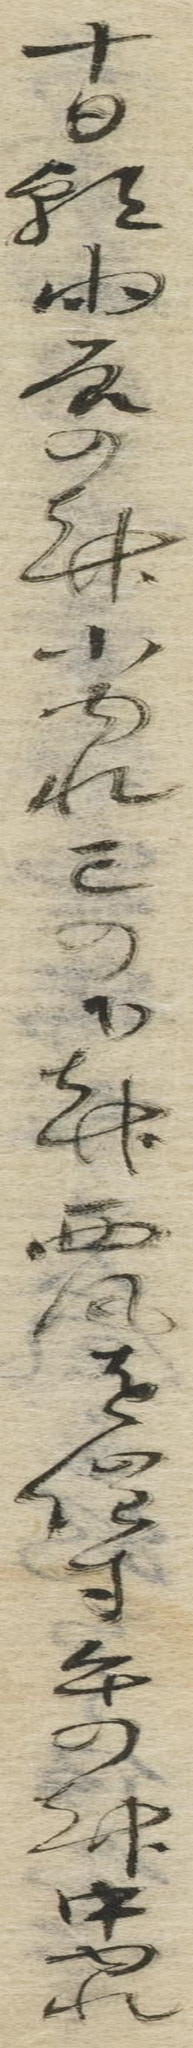十日朝雨辰の刻小ゆれ巳の下刻西風を催す午の刻中ゆれ

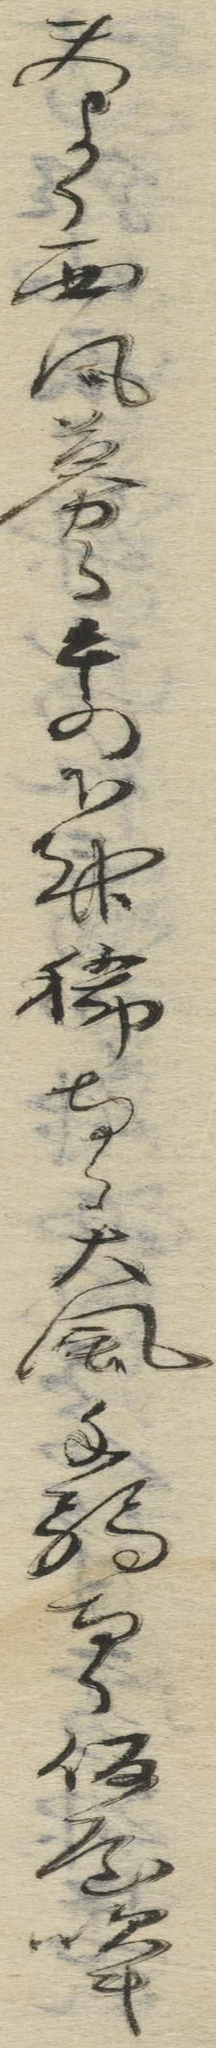夫より西風募る午の下刻稀なる大風手弱なり仮家吹キ
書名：弘化丁未天變日記
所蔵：東京大学地震研究所図書室 Earthquake Research Institute Library, The University of Tokyo, JAPAN
